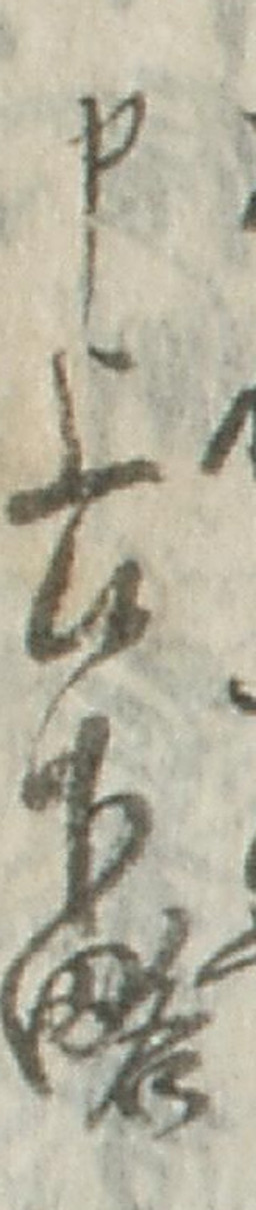申上候下略
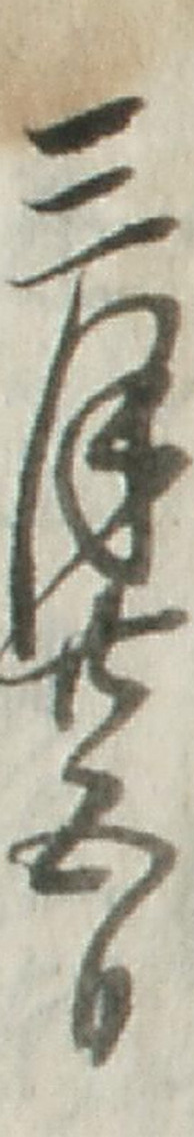三月廿五日
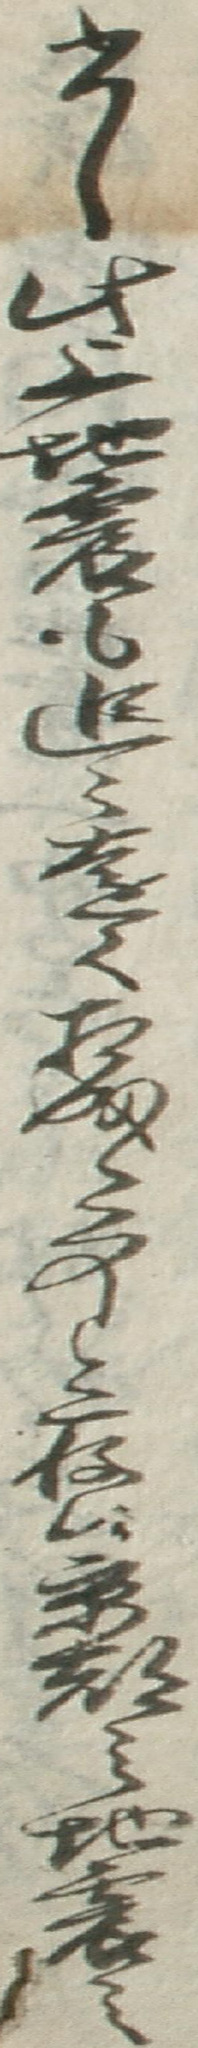尚々此上地震も追々遠く相成候事と存候京都之地震之
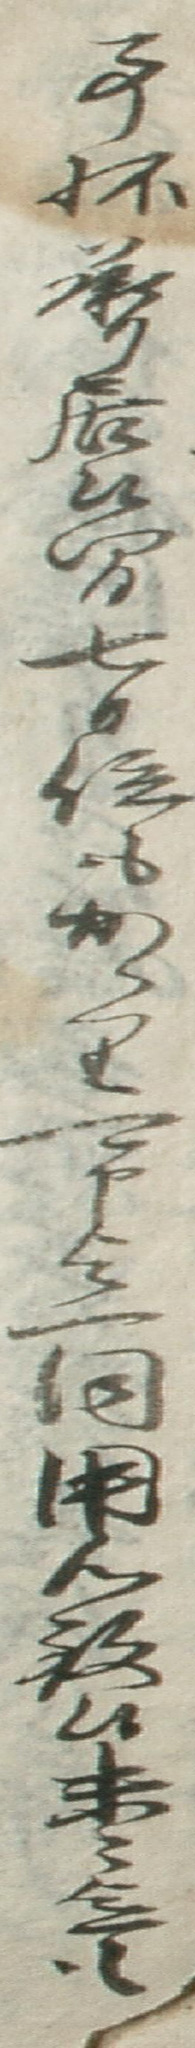事抔承り居候間七日位もかゝり可申と一同用心致候未々迄も

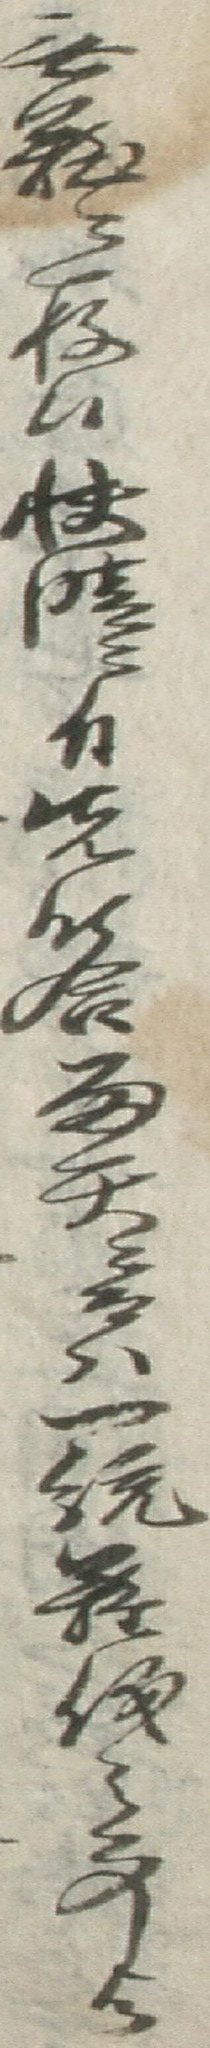無難二存候快晴二付先仕合雨天二而ハ一統難儀之事と
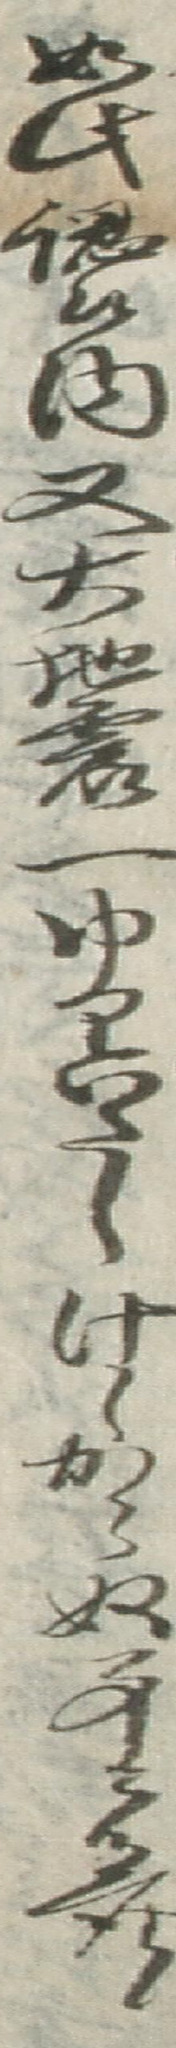如此認候内又大地震一ゆり候ハゝけしからぬ事二御座候
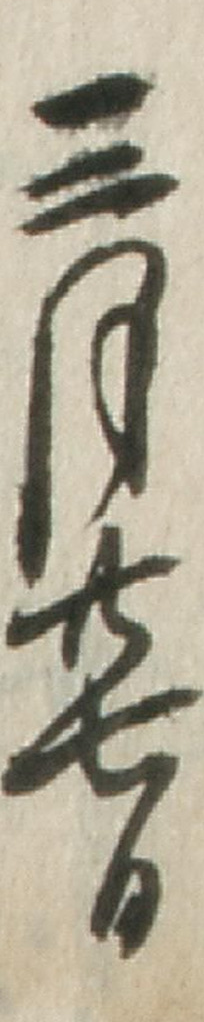三月廿七日
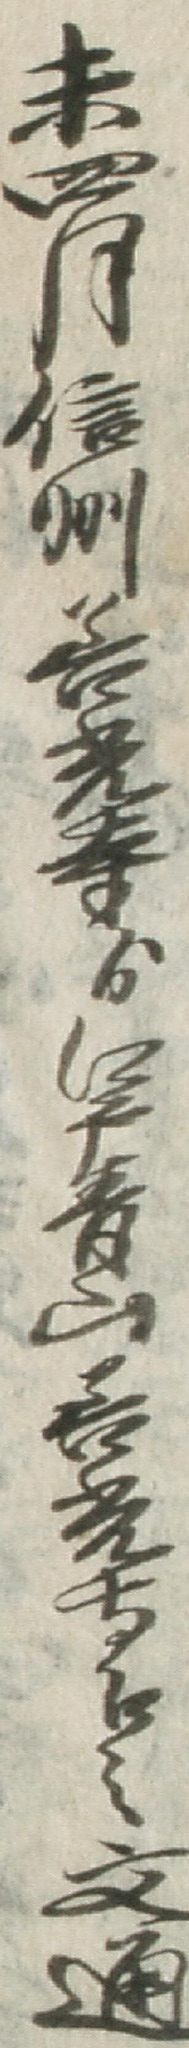未四月信州善光寺ゟ江戸青山善光寺江之文通
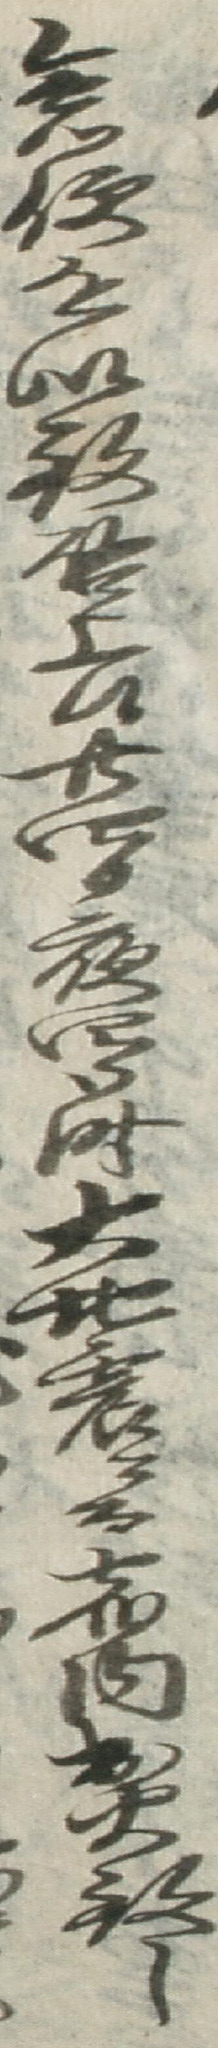急便を以致啓上候廿四日夜四ッ時大地震二而宿内出火致し
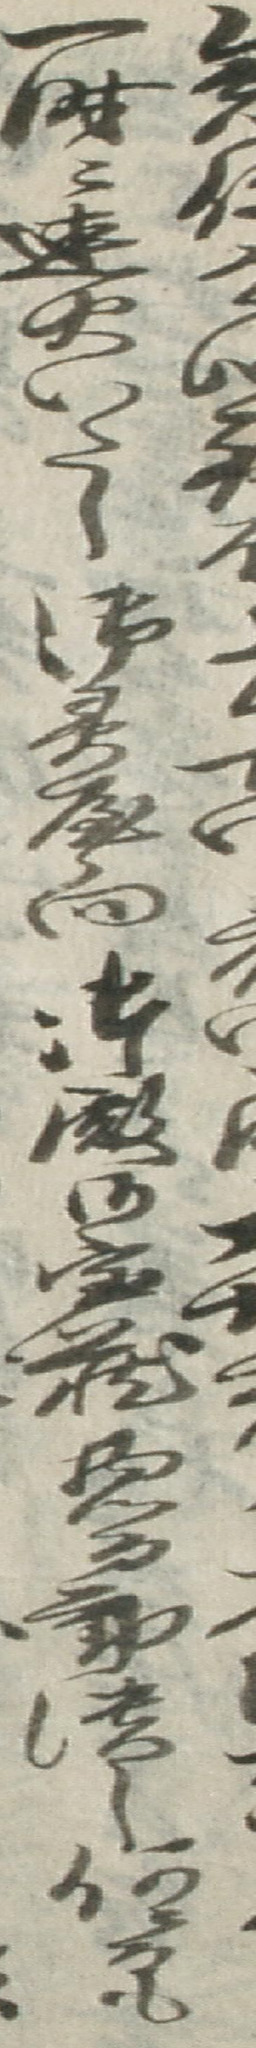一時二連火いたし御㚑屋向御殿御宝蔵惣而動潰し何二而も
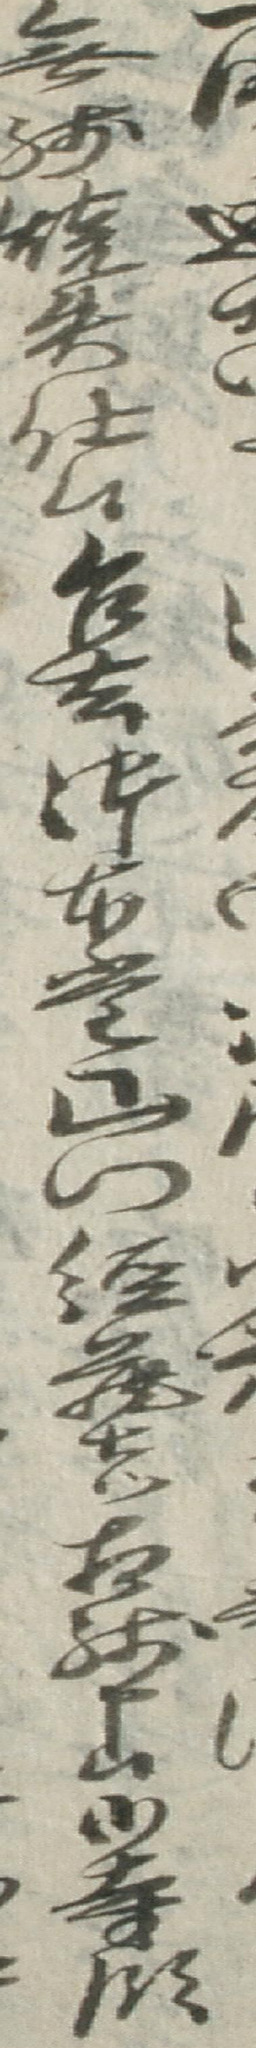無残焼失仕候乍去御本堂山門経蔵は相残申候御寺領
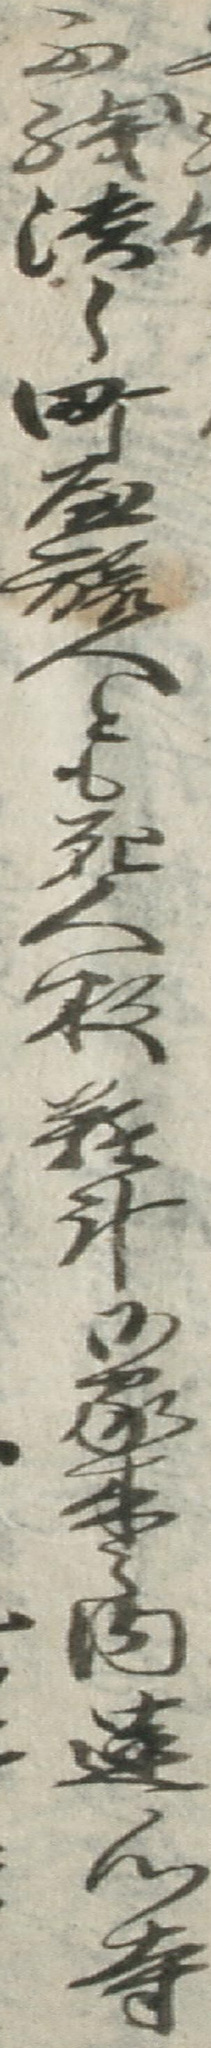不残潰し町屋旅人とも死人数難計御家中之内連心寺
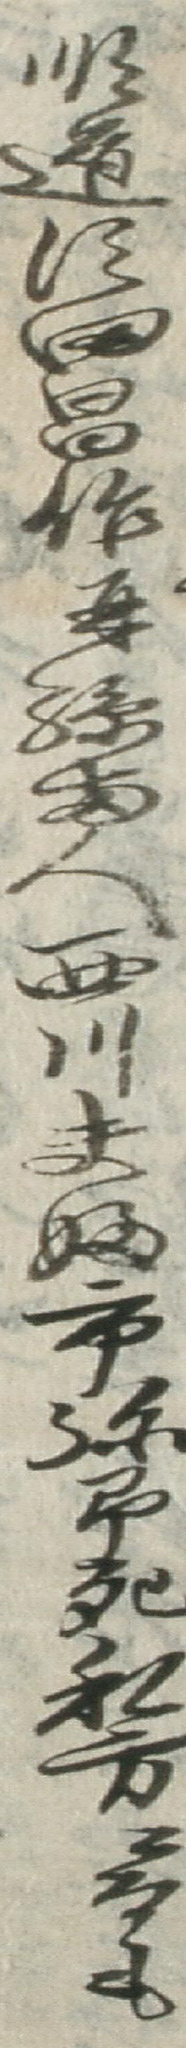順道須田昌作并孫両人西川夫婦市弥即死私方二而も
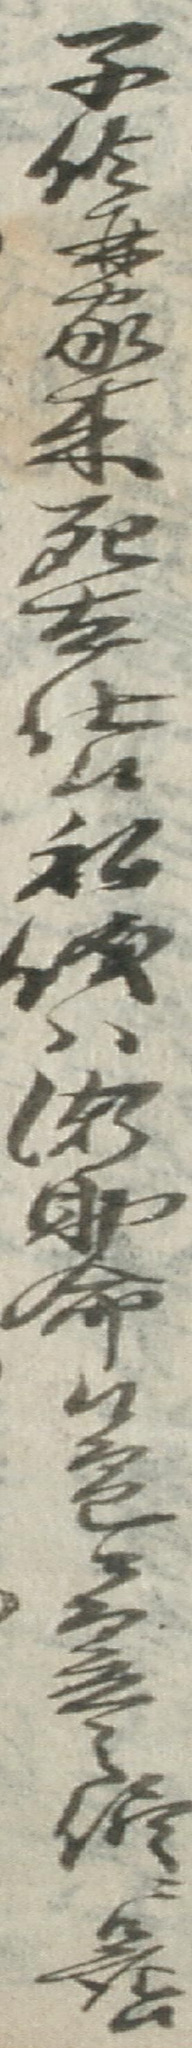子供并家来死去仕候私儀ハ漸助命候而巳二而立候儘二御座候
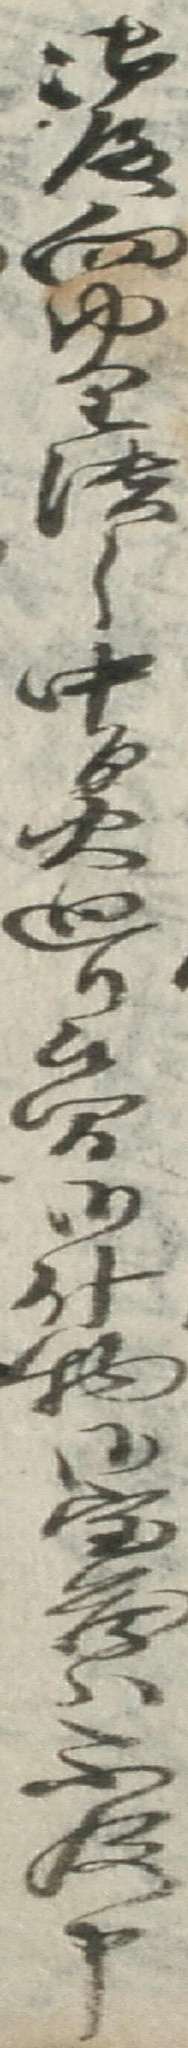御殿向ゆり潰し中ゟ火廻り候間御什物御宝蔵ハ不及申
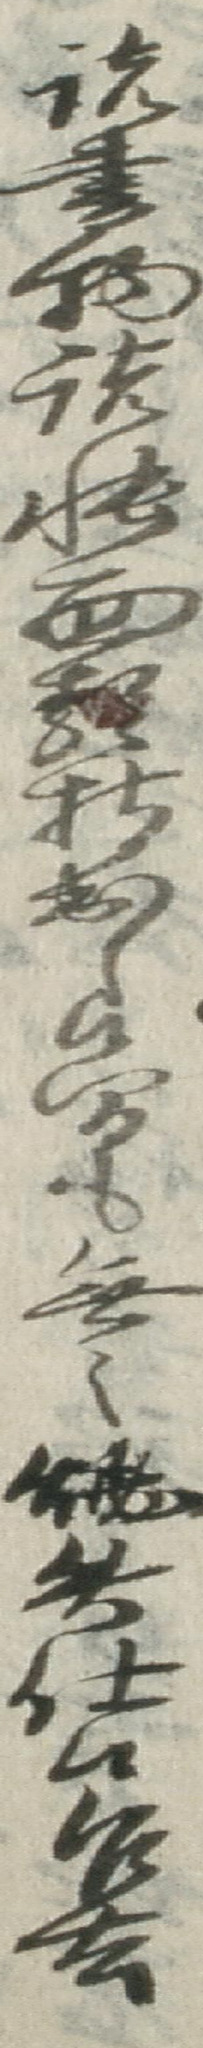諸書物諸帳面類持出し候間も無く焼失仕候乍去
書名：信濃國地震實録記
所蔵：東京大学地震研究所図書室 Earthquake Research Institute Library, The University of Tokyo, JAPAN
